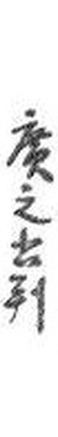広之書判
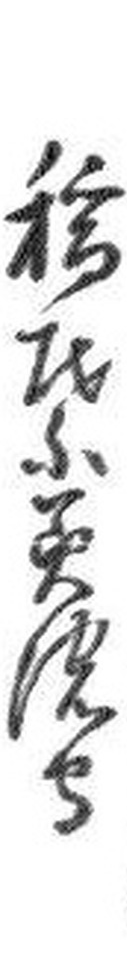稲葉美濃守
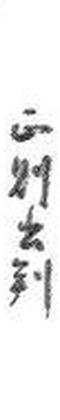正則書判
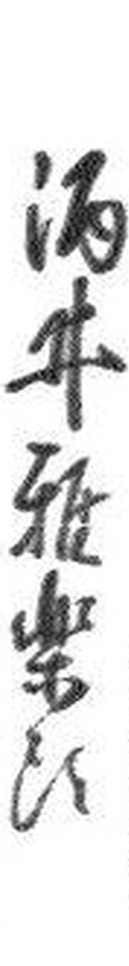酒井雅樂頭
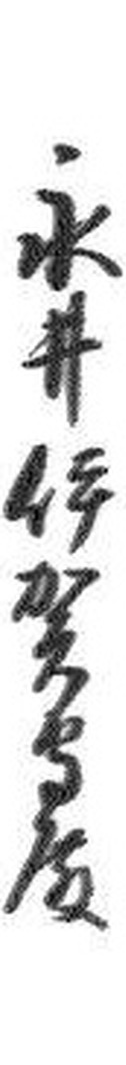永井伊賀守殿
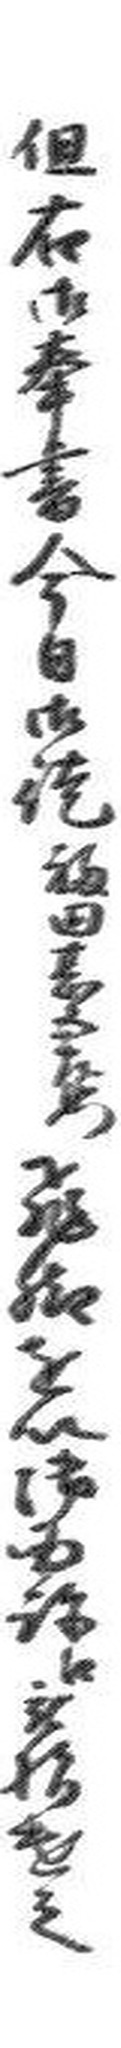但右御奉書今日御徒福田甚左衛門飛脚を以御国許江被指遣之

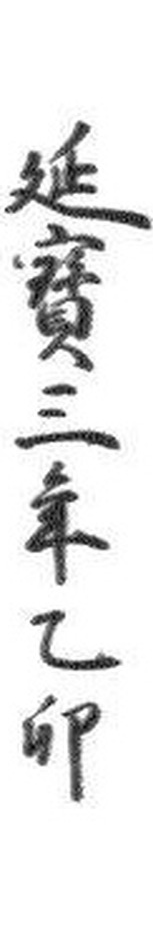延宝三年乙卯
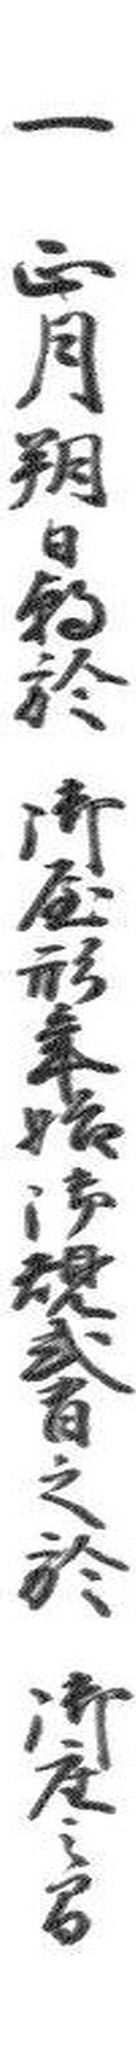一正月朔日朝於御屋形年始御規式有之於御座之間
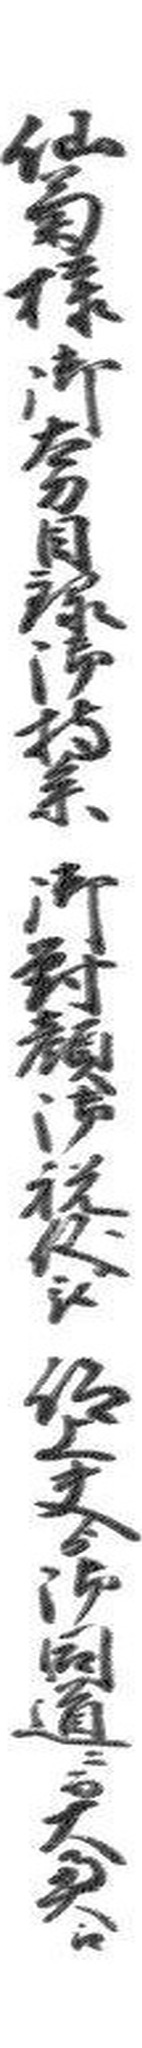仙菊様御太刀目録御持参御対顔御祝儀被仰上夫ゟ御同道ニ而大奥江
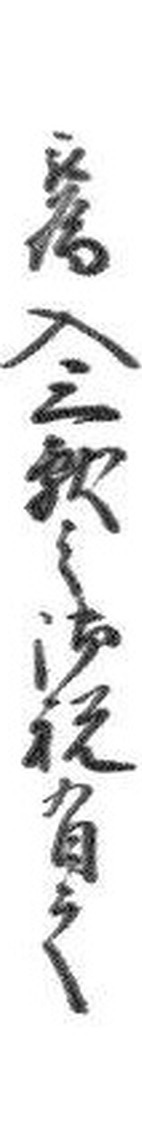被為入三献之御祝有之
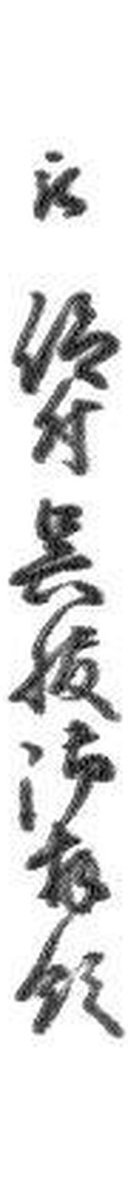被仰付呉服御拝領
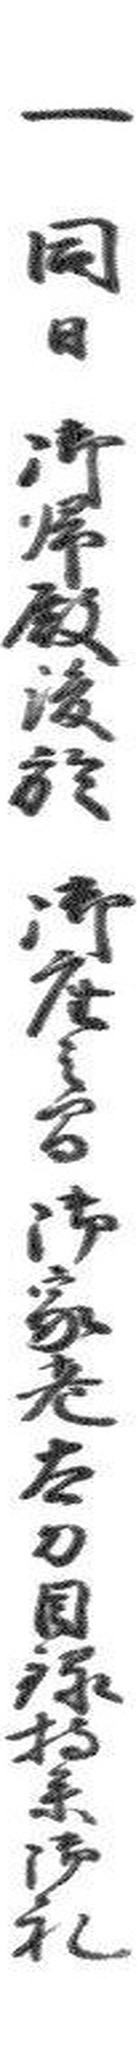一同日御帰殿後於御座之間御家老太刀目録持参御礼

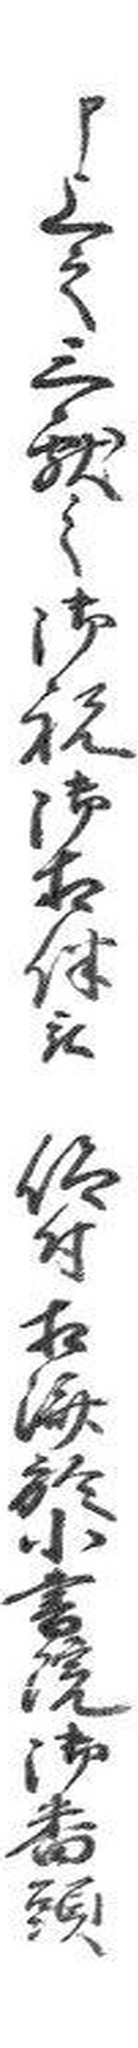申上之三献之御祝儀御相伴被仰付相済於小書院御番頭
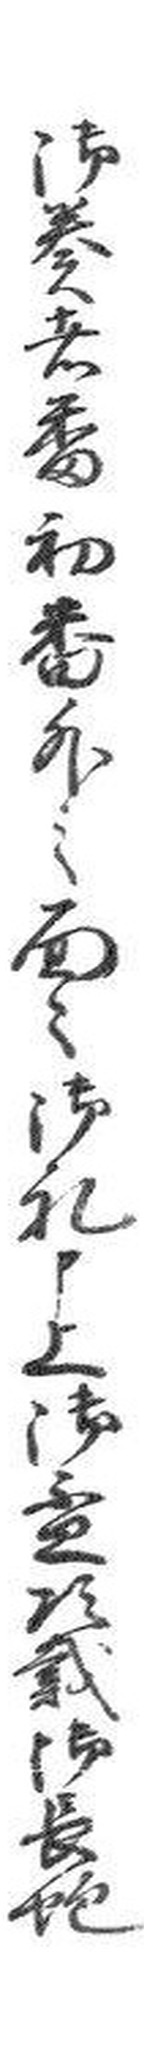御奏者番初番外之面々御礼申上御盃頂戴御長蚫
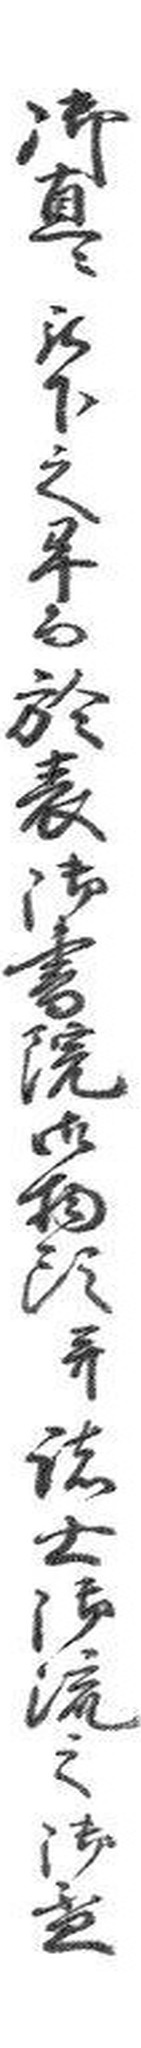御直ニ被下之畢而於表御書院御物頭并諸士御流之御盃
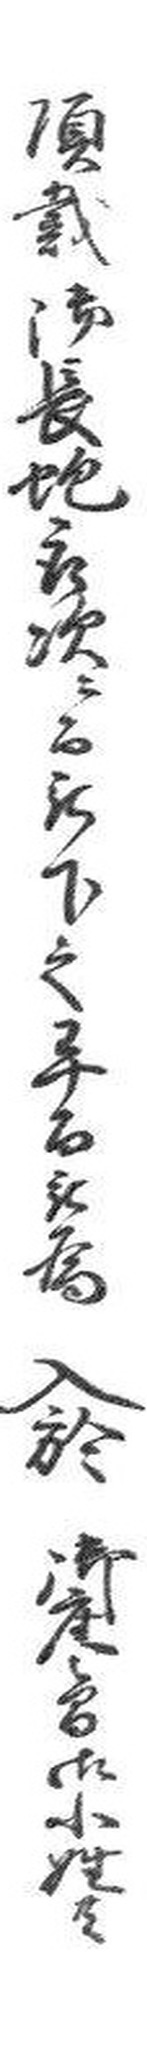頂戴御長蚫取次ニ而被下之畢而被為入於御座之間御小姓共
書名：家譜 十一 昌親公 従延宝二年到延宝四年八月
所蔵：福井県文書館 Fukui Prefectural Archives
